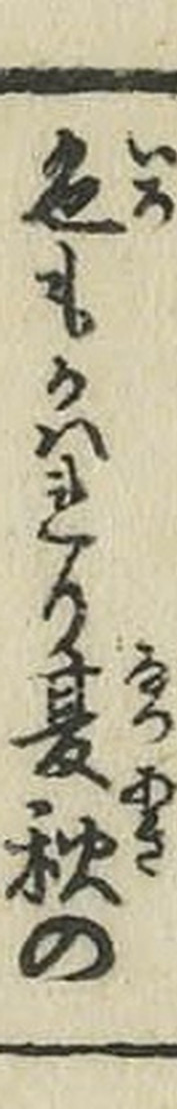色もかはれり夏秋の
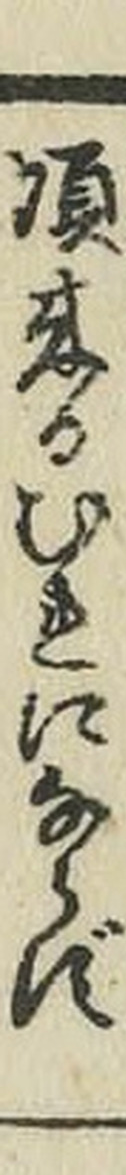頃来るむれにならず
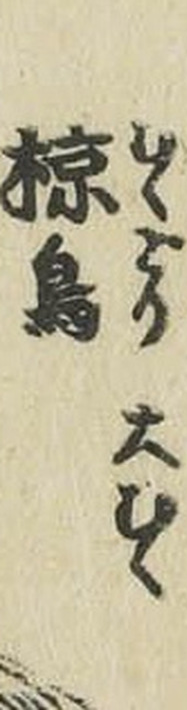椋鳥大むく
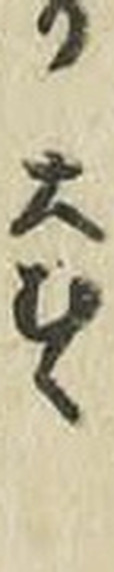小むく
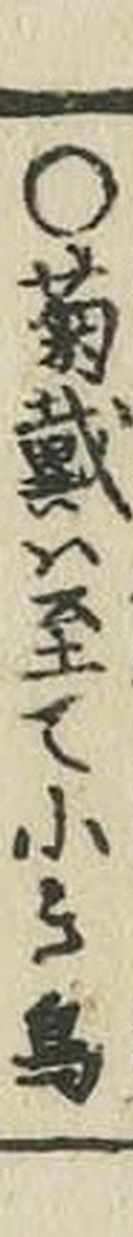○菊戴は至て小き鳥
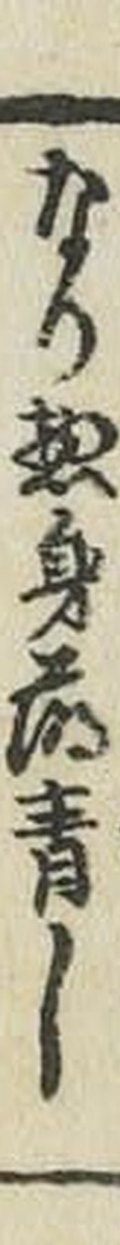なり惣身薄青し
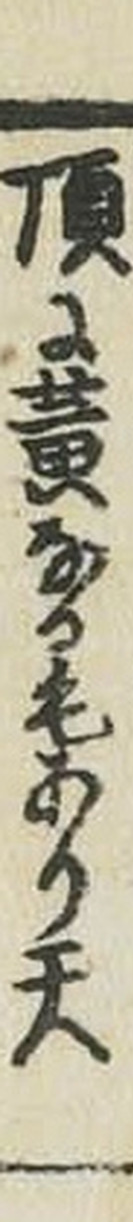頂に黄なる毛あり天
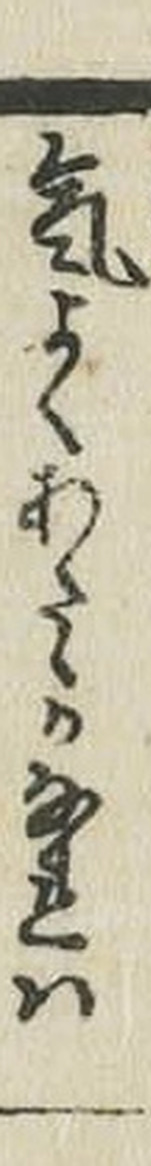気よくあたゝかなれは
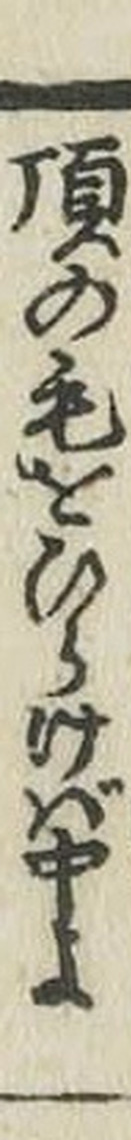頂の毛をひらけば中よ
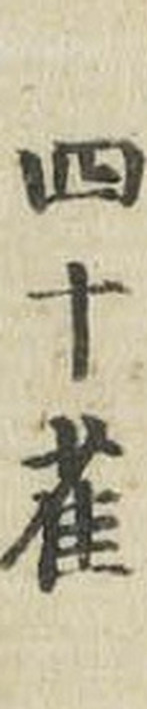四十雀
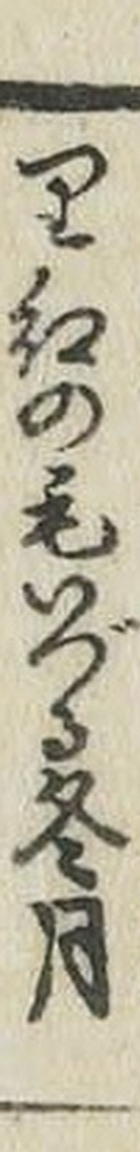り紅の毛いづる冬月
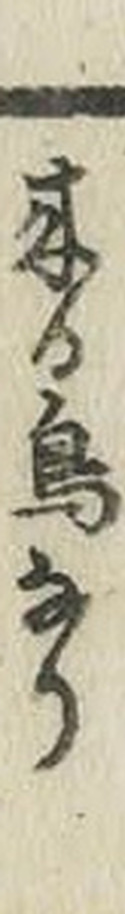来る鳥なり
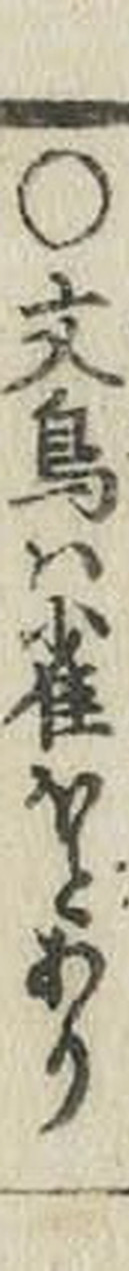○文鳥は雀ほどあり
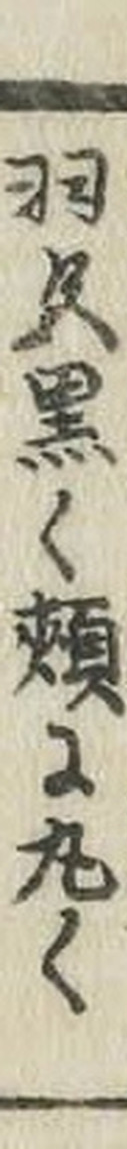羽色黒く頬に丸く
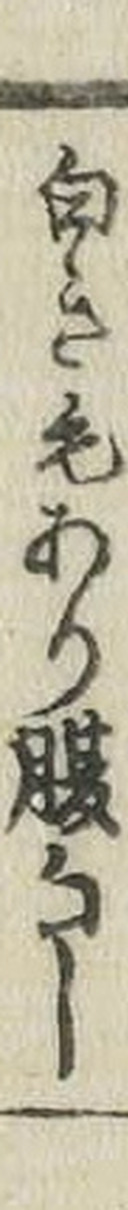白き毛あり腹白し
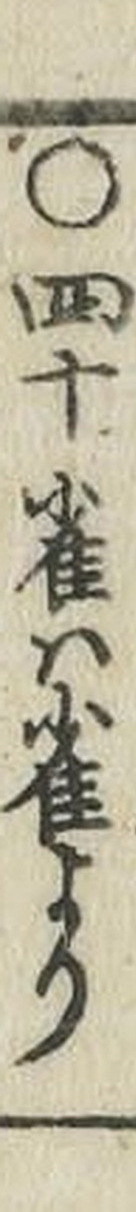○四十雀は雀より
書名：増補頭書訓蒙図彙大成 10巻 6:巻之12-13
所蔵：東京学芸大学教育コンテンツアーカイブ
